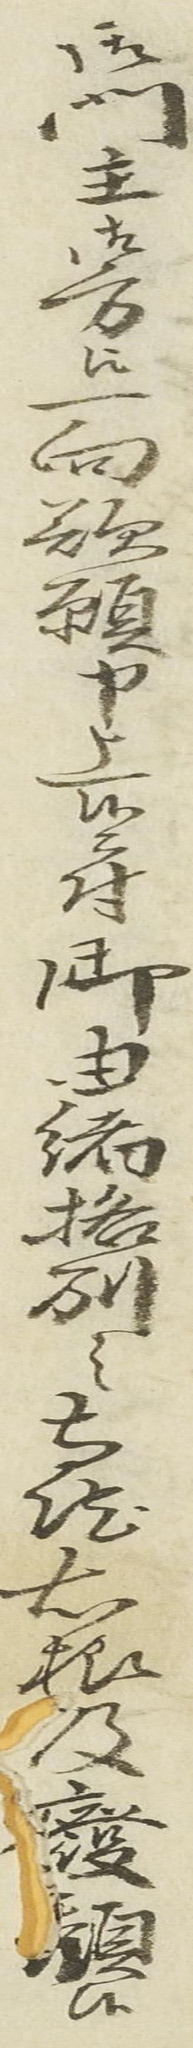御門主御方え一向歎願申上候ニ付御由緒格別之寺院右様及廃頽候
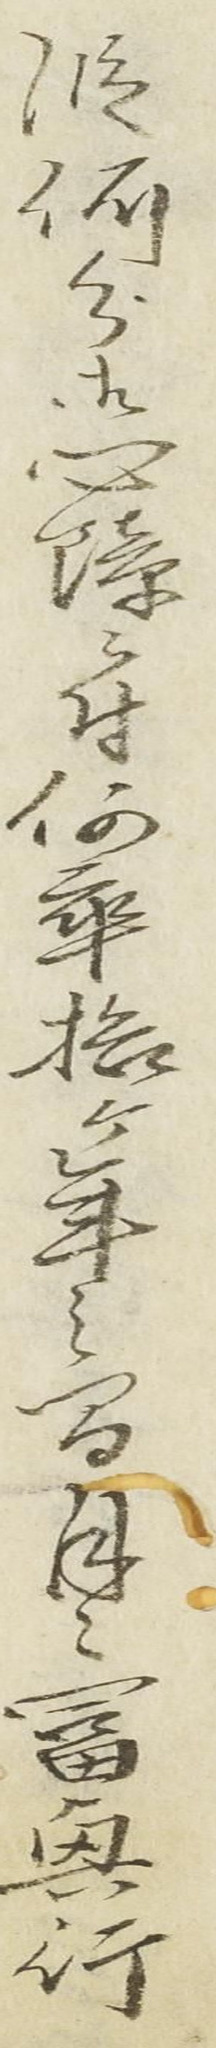段何分御心障ニ付何卒拾ケ年之間月々富興行
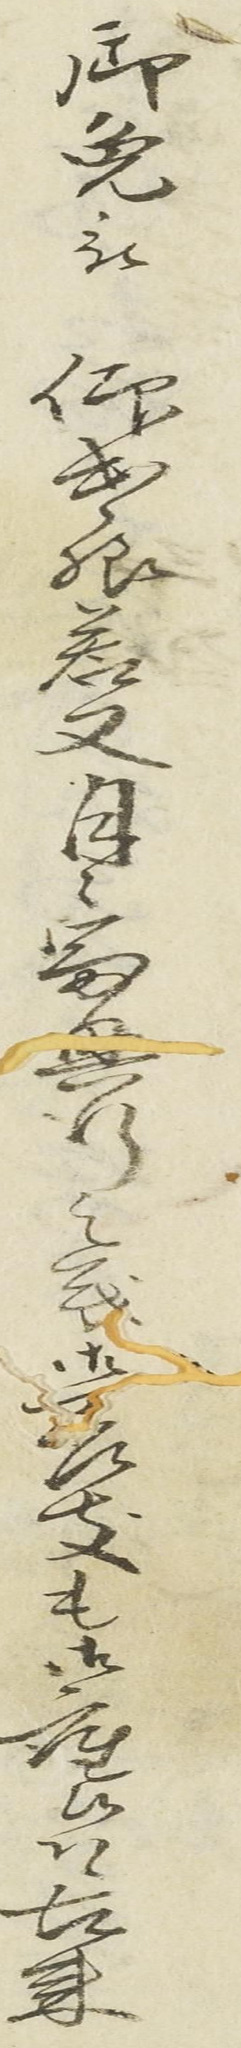御免被仰出候様若又月々富興行之義御差支も御座候ハゝ古来
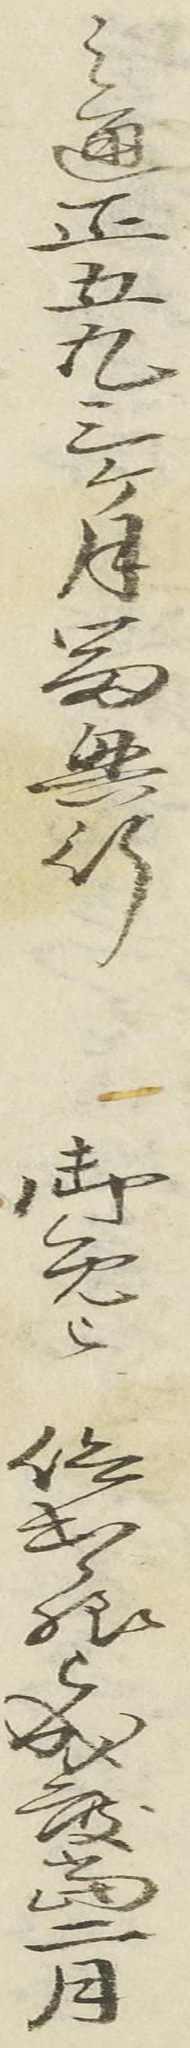之通正五九三ケ月富興行御免被仰出候様被成度當二月
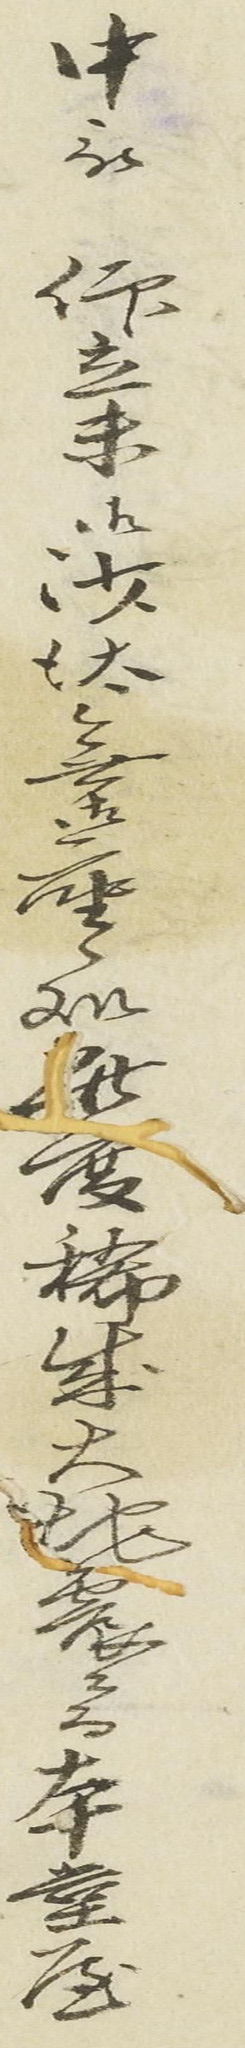中被仰立未御沙汰無御座候処此度稀成大地震ニ而本堂屋
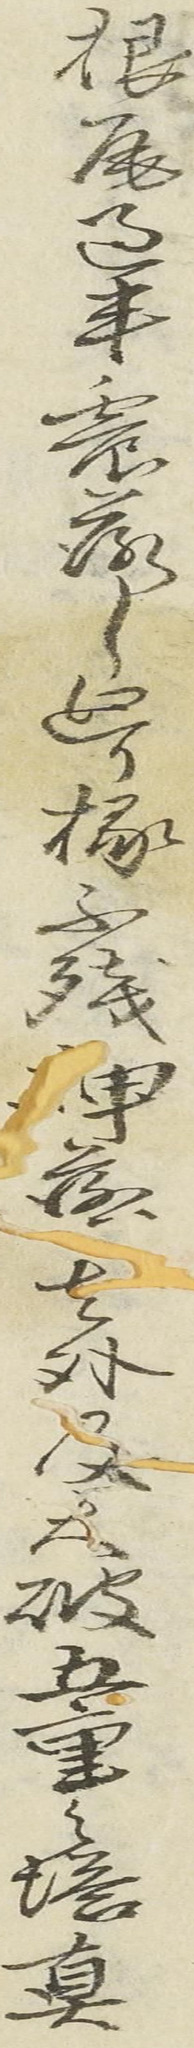根瓦過半震落し廻り椽不残押落其外及大破五重之塔真
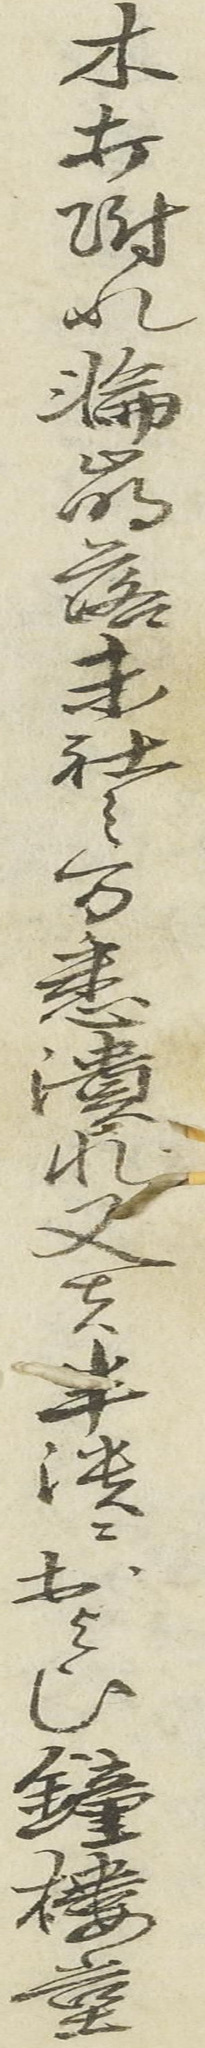木打附れ輪崩落ち末社之分悉潰れ又は半潰ニおよひ鐘楼堂
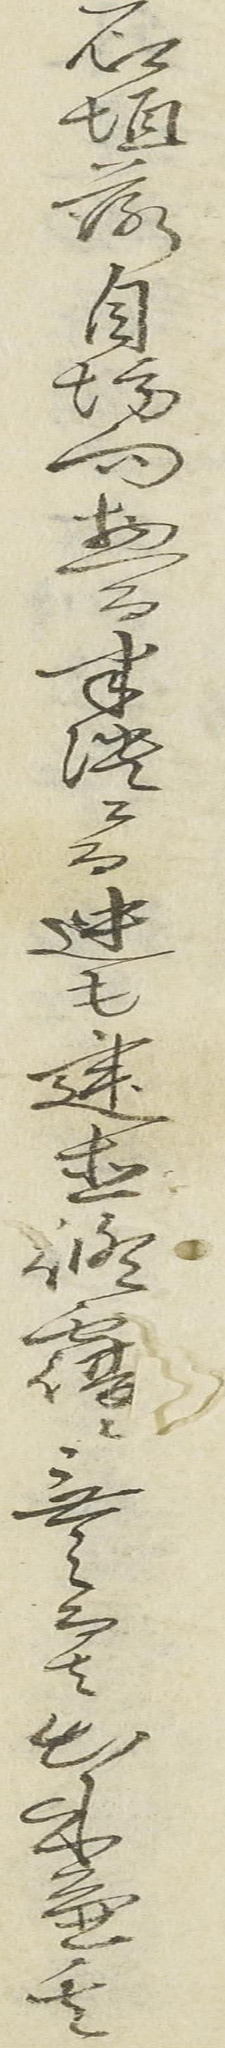石垣落自坊向惣而半潰ニ而迚も建直修覆ニ無之而は出来兼其

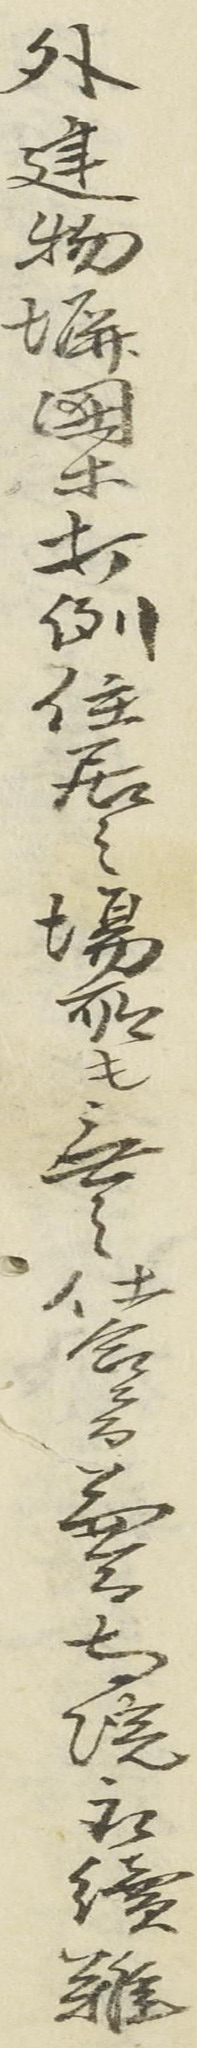外建物塀囲等打倒住居之場所も無之仕合ニ而兼而寺院取続難
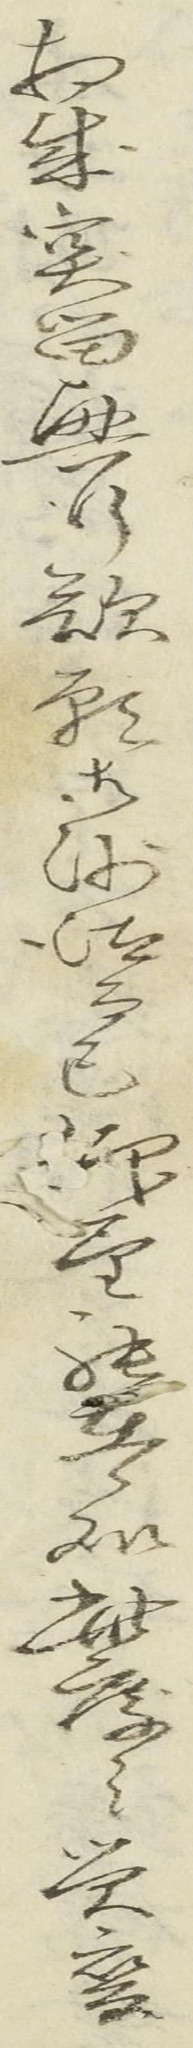相成突留興行歎願御沙汰而已御望罷在候処此度之災変
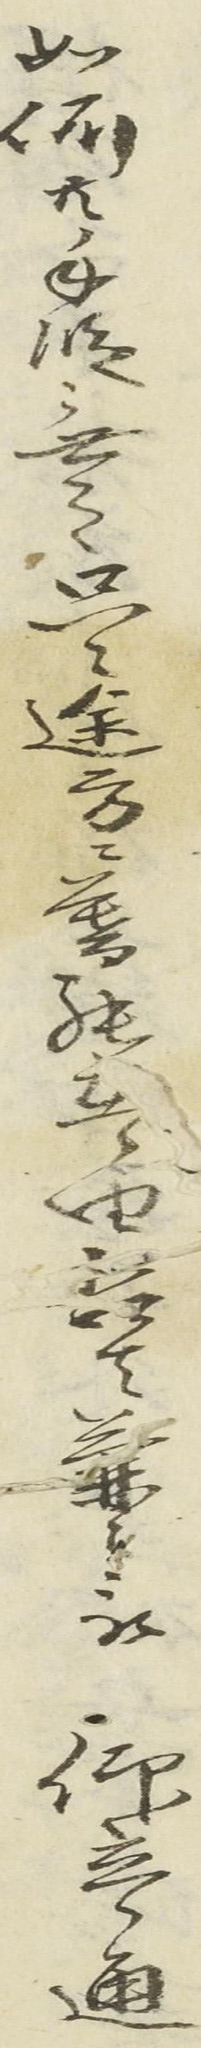如例共手段無之只々途方ニ暮罷在候由右は兼々被仰立候通
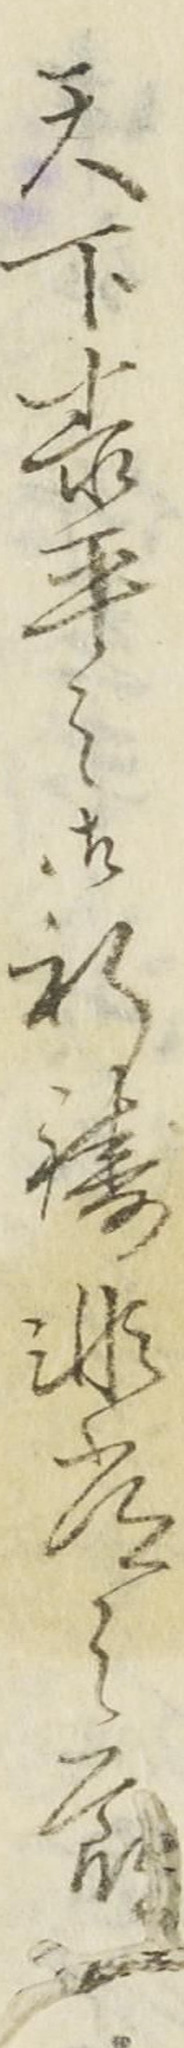天下泰平之御祈祷非常之節
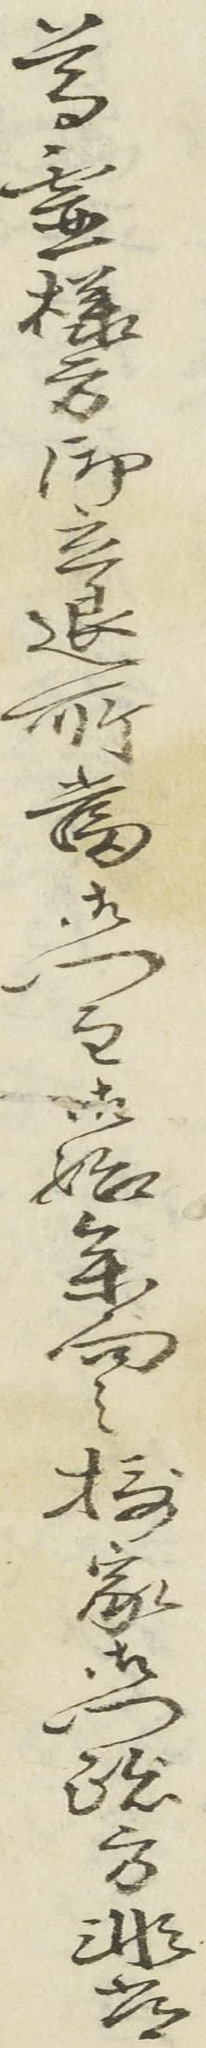尊霊様方御立退所当御門主御始参向之摂家御門跡方非常
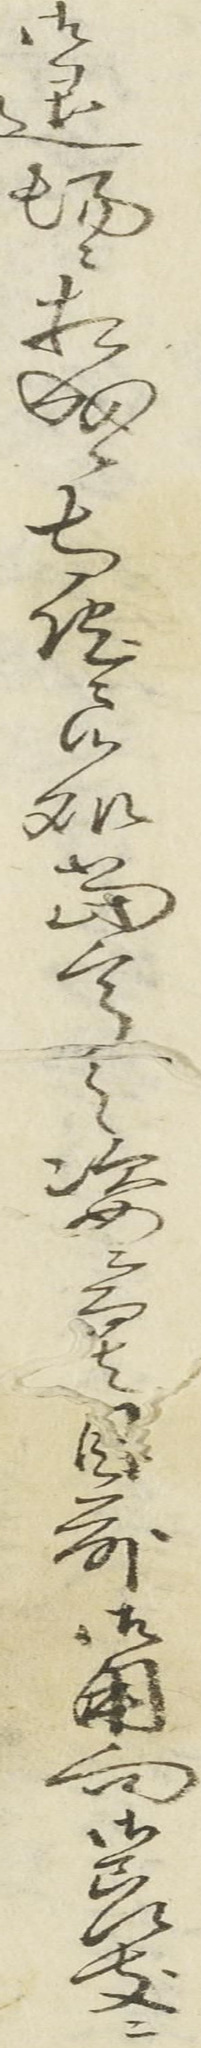御退場ニ相成候寺院ニ候処当今之姿ニ而は目前御用向御差支ニ
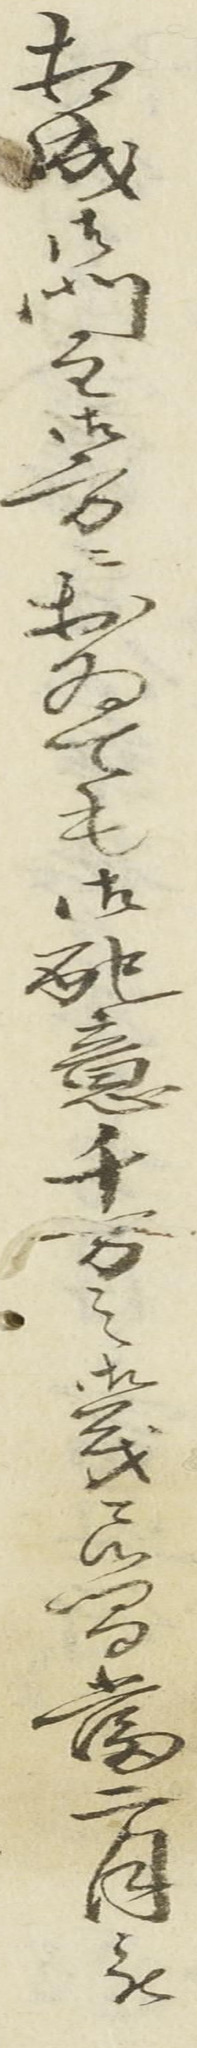相成御門主御方ニおゐても御配意千万之御義ニ候間當二月被
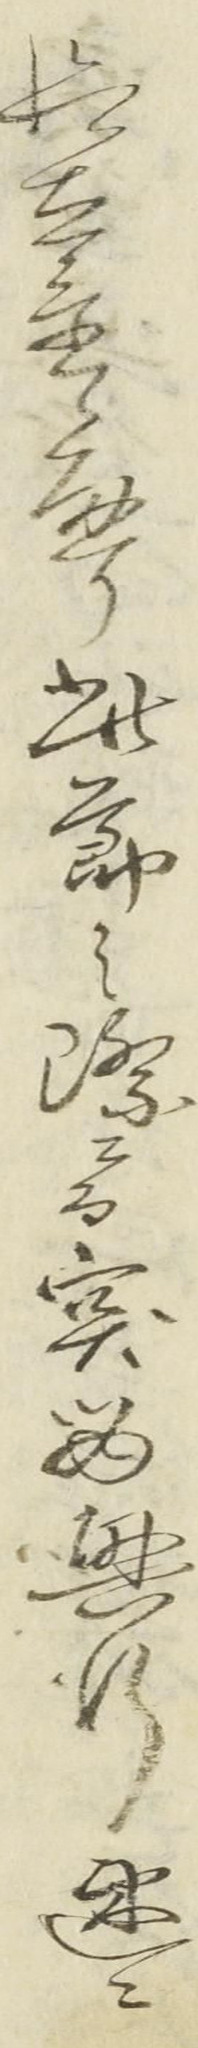仰立置候通り此節之際ニ而突留興行速ニ
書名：安政二乙卯年十月二日大地震之事
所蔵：東京大学地震研究所図書室 Earthquake Research Institute Library, The University of Tokyo, JAPAN
